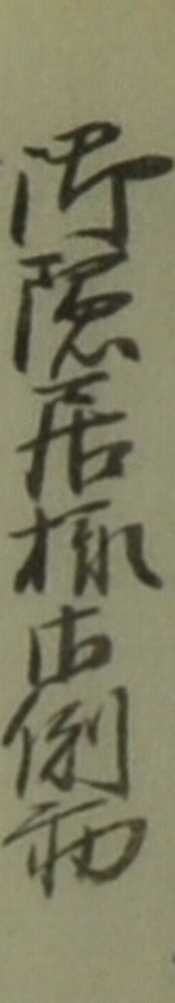御隠居様御側勤
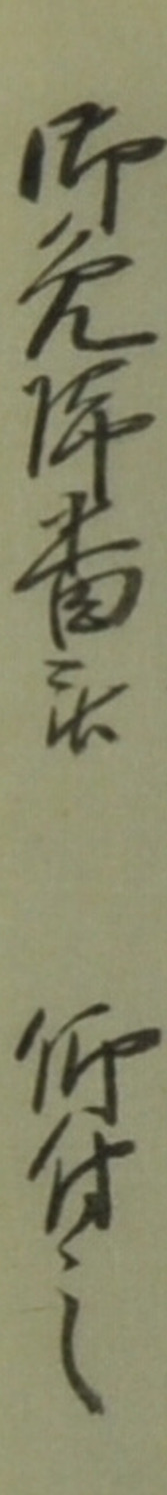御免帰番被仰付之

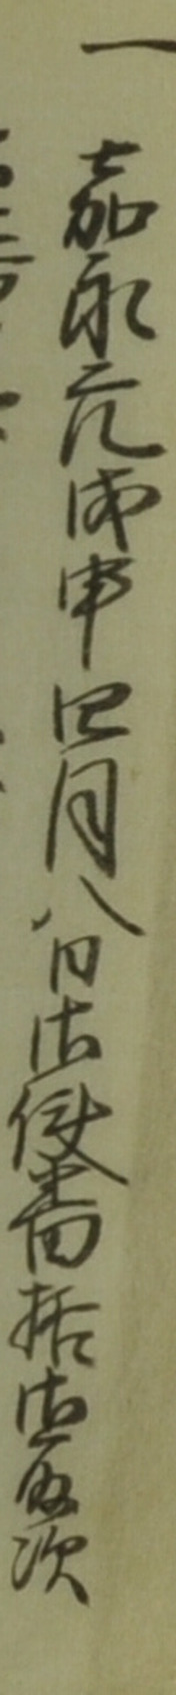一嘉永元戊申四月八日御使番格御取次
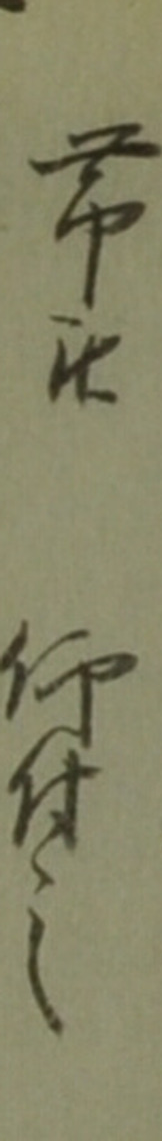帯被仰付之
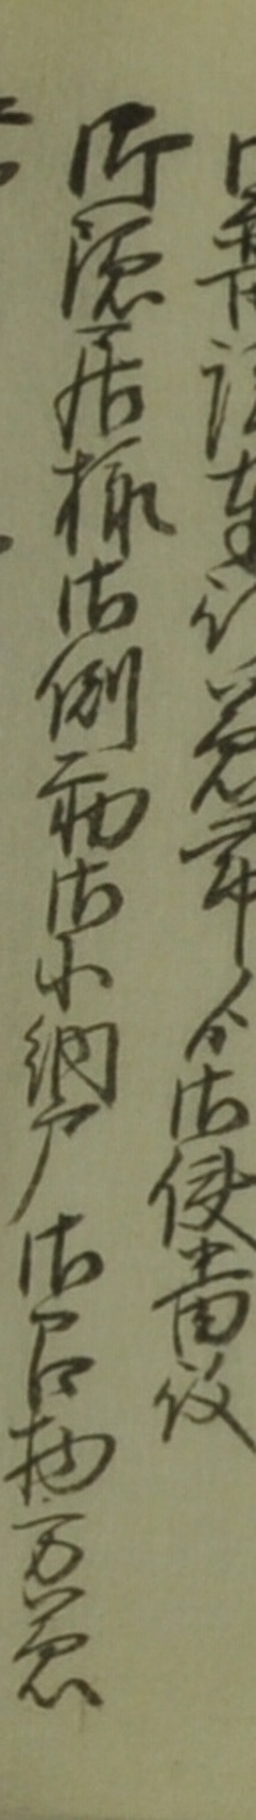御隠居様御側勤御小納戸御召物方兼
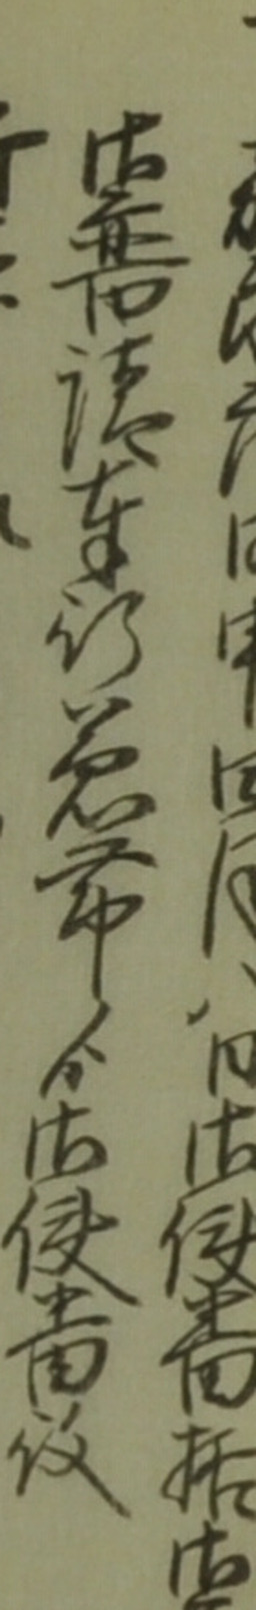御普請奉行兼帯ゟ御使番役
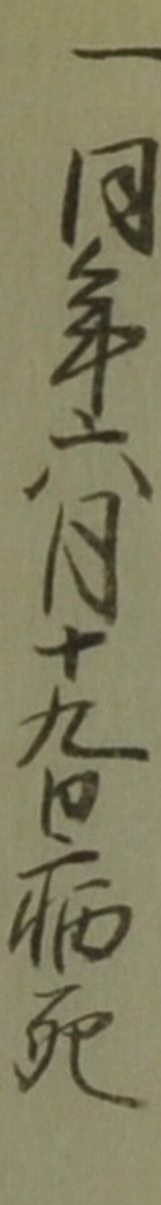一同年六月十九日病死
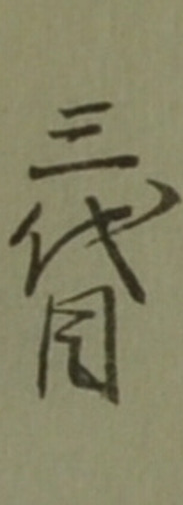三代目
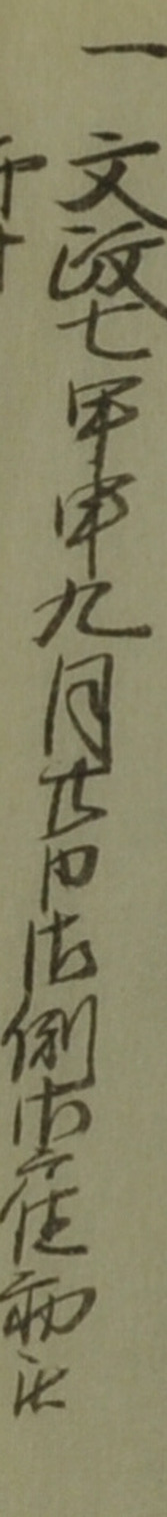一文政七甲申九月廿日御側御雇勤被
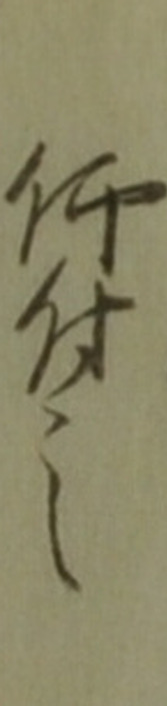仰付之
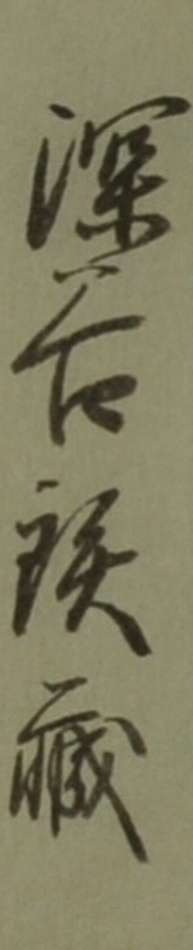深谷鉄蔵
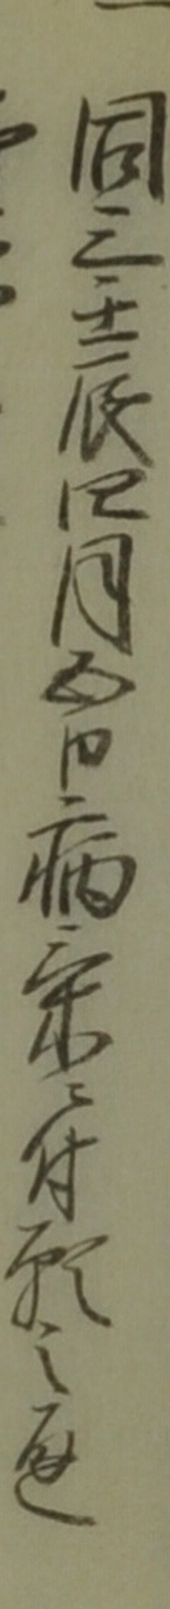一同三壬辰四月五日病気ニ付願之通
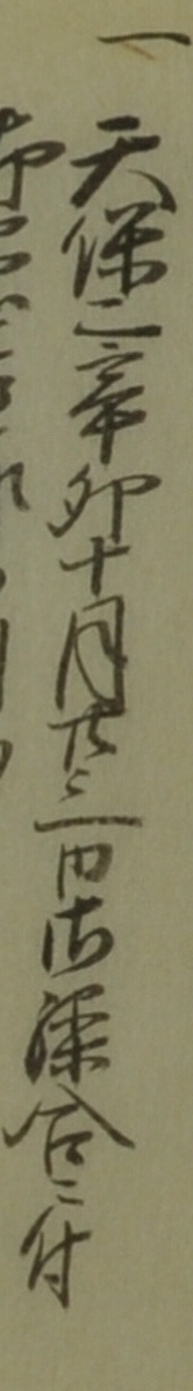一天保二辛卯十月廿三日御繰合ニ付
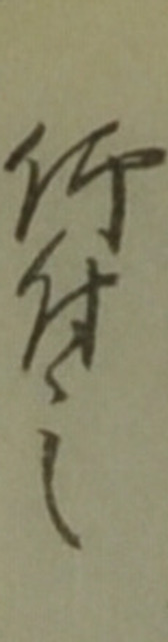仰付之
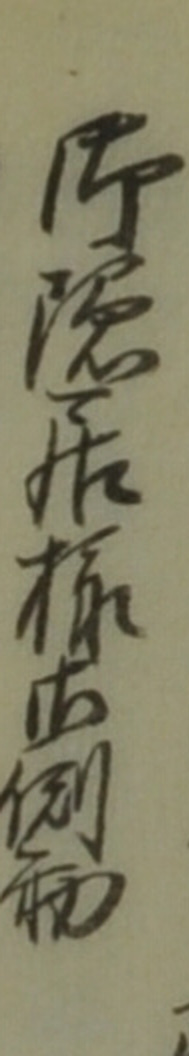御隠居様御側勤
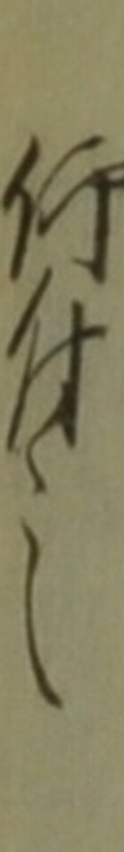仰付之
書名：諸御役代々録（五）
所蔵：伊那市立高遠町図書館・合同会社AMANE
